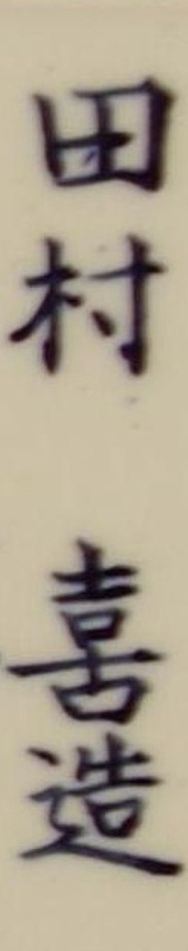田村喜造
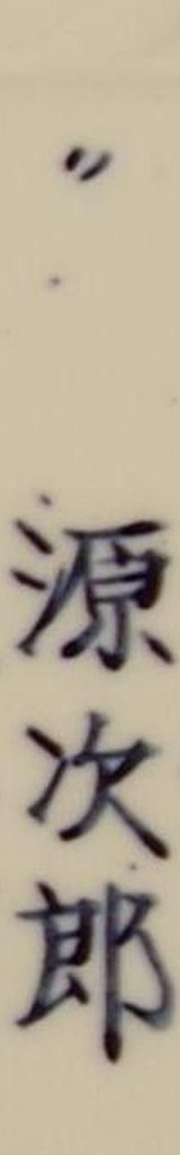源次郎
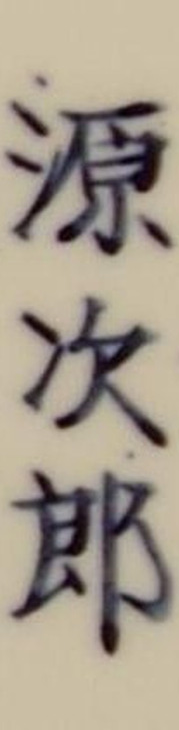源次郎
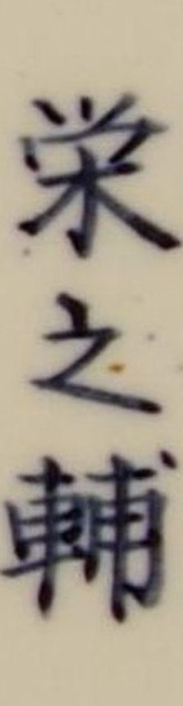栄之輔
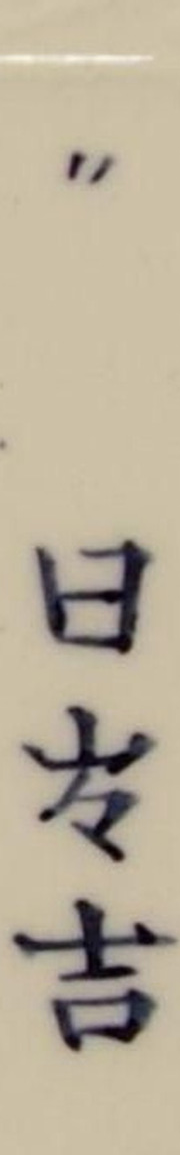日出吉
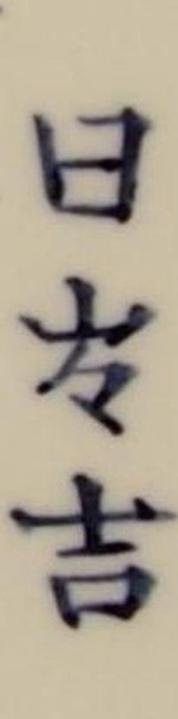日出吉
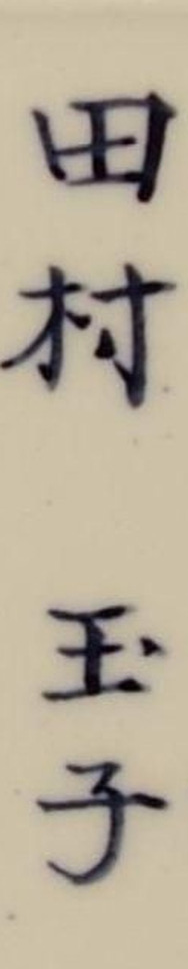田村玉子
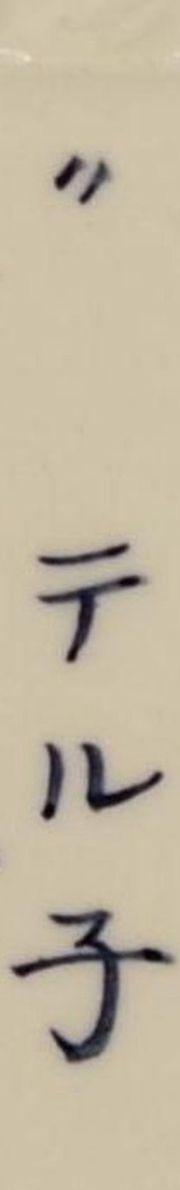テル子
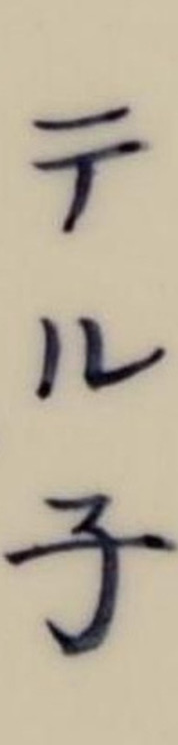テル子
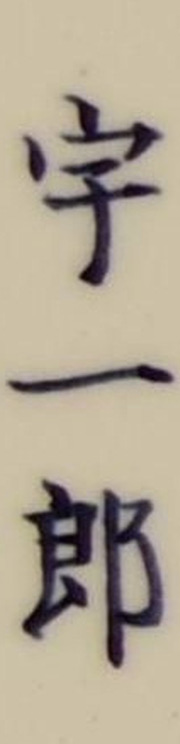宇一郎

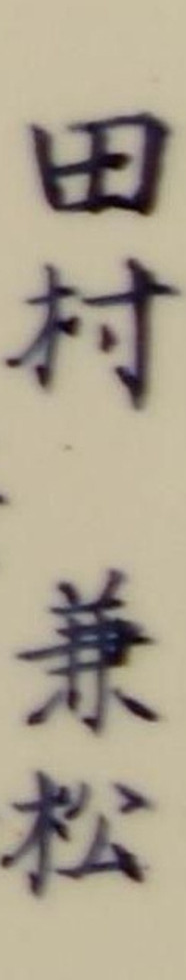田村兼松
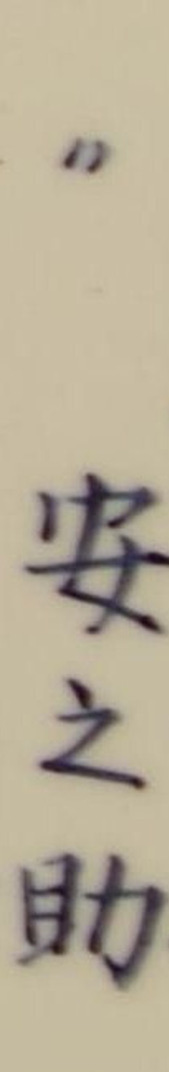安之助
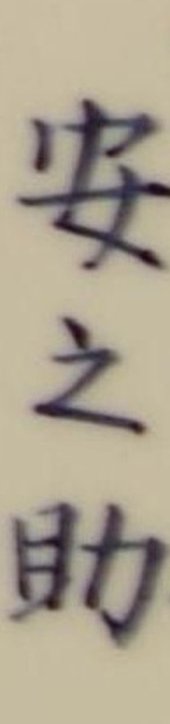安之助
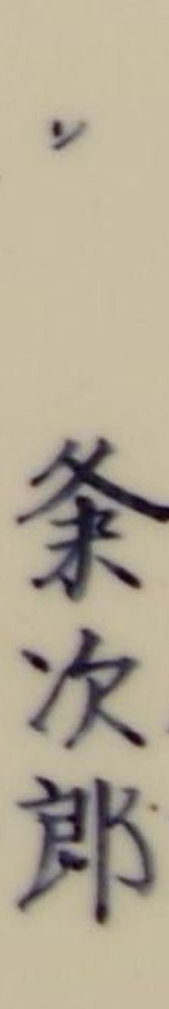粂次郎
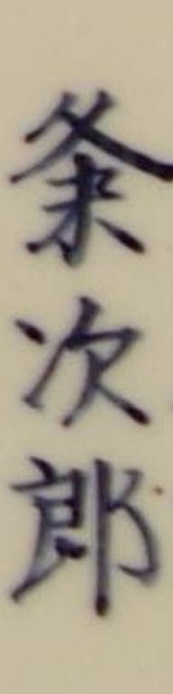粂次郎
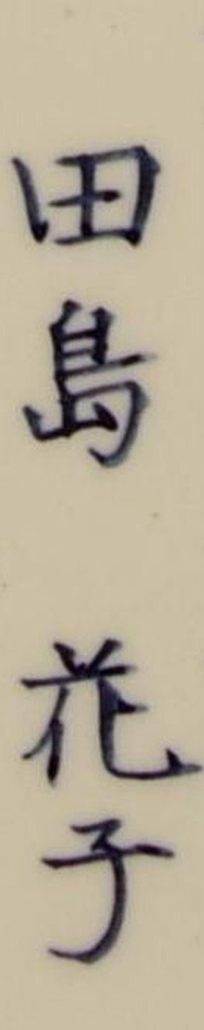田島花子
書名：A~D
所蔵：koyasan kongobuji
